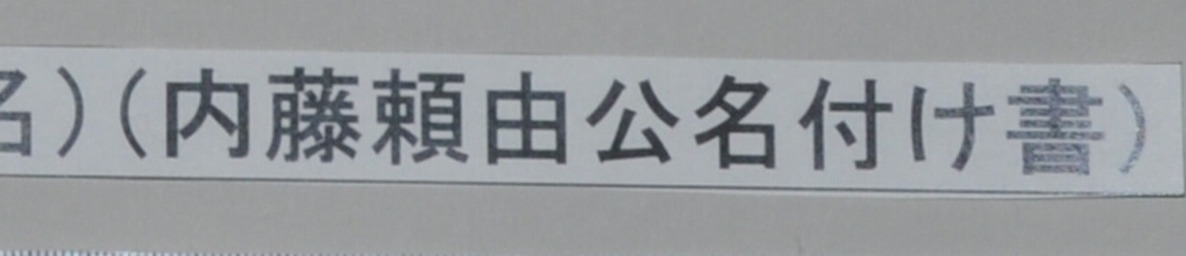内藤頼由公御名付書

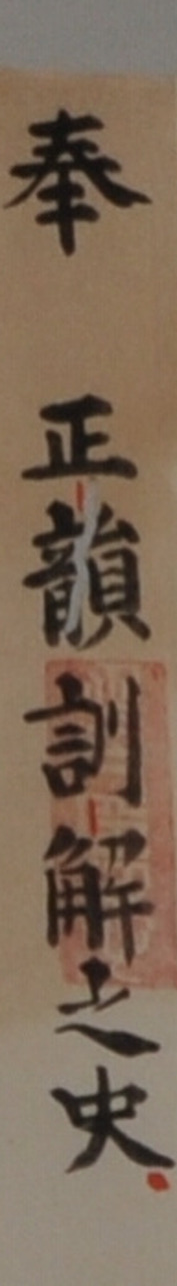奉正-韻訓-解之史。
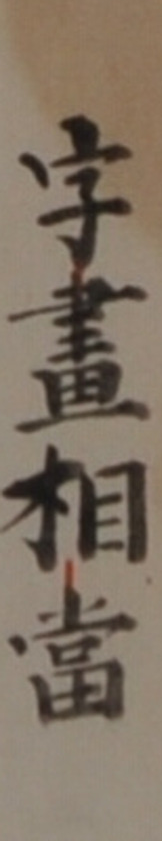字-画相-当
